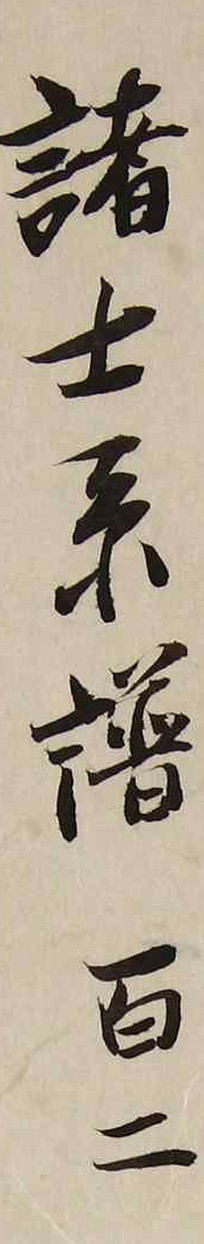諸士系譜百二

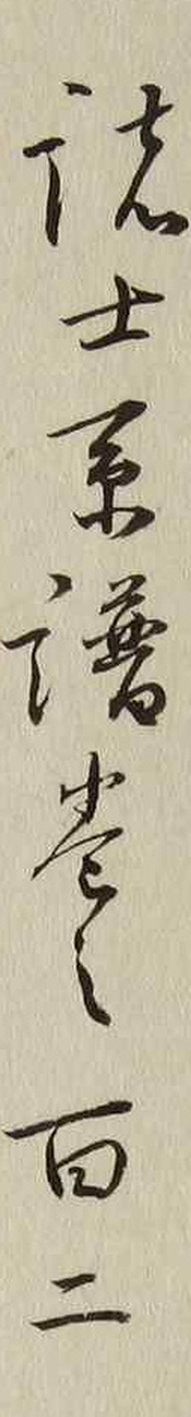諸士系譜巻之百二
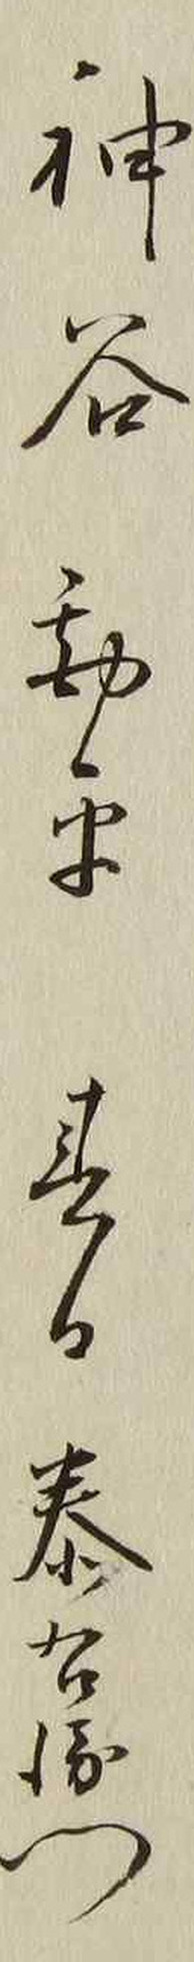神谷勘平春日泰右衛門
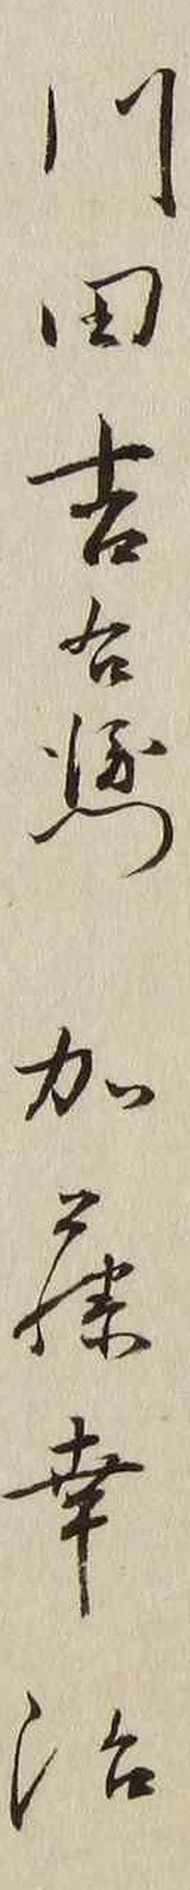河田吉右衛門加藤幸治

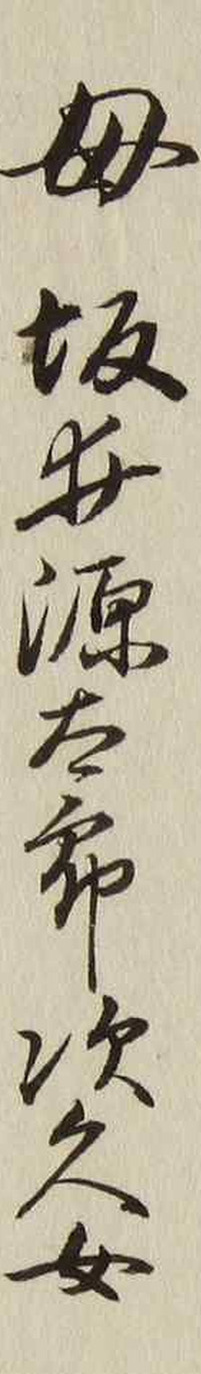母坂井源太郎次久女
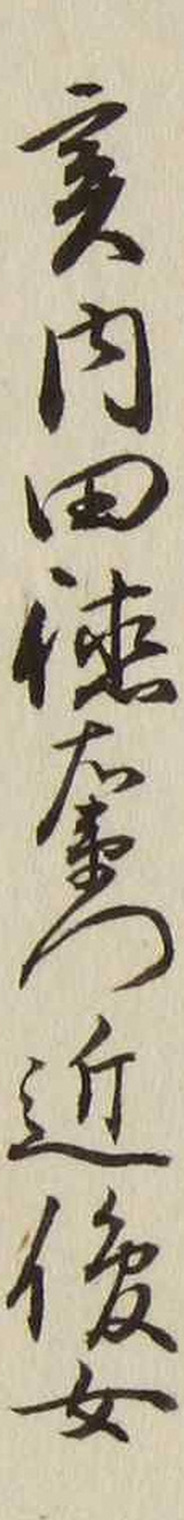実内田徳右衛門近俊女

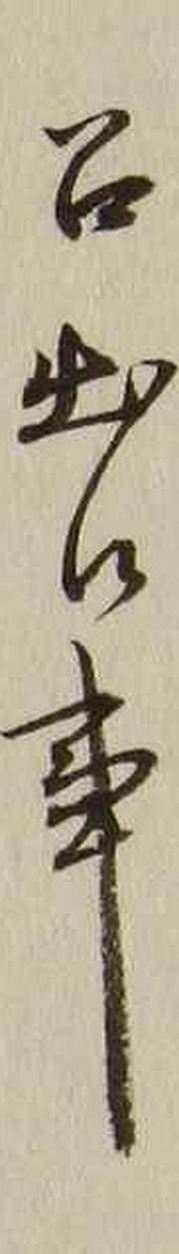召出候事
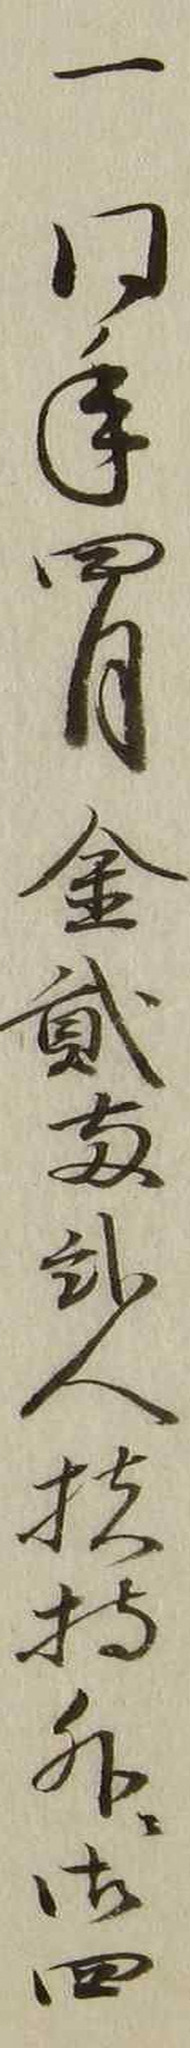一同年四月金貳両弐人扶持外御四
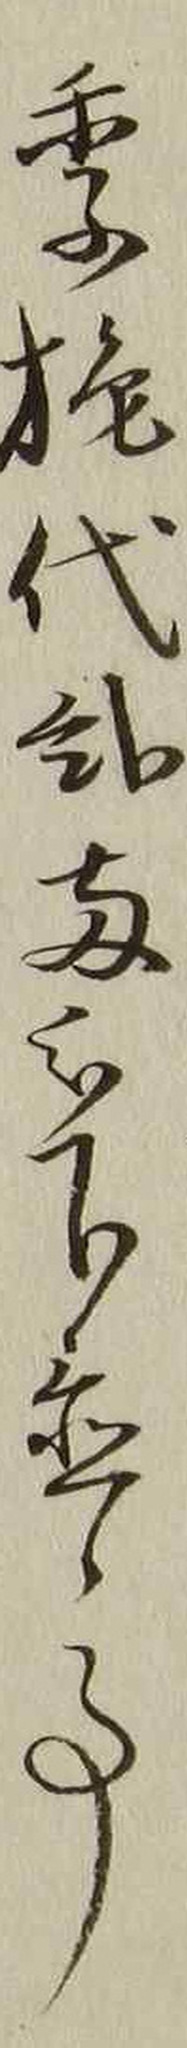季施代弐両被仰下置候事
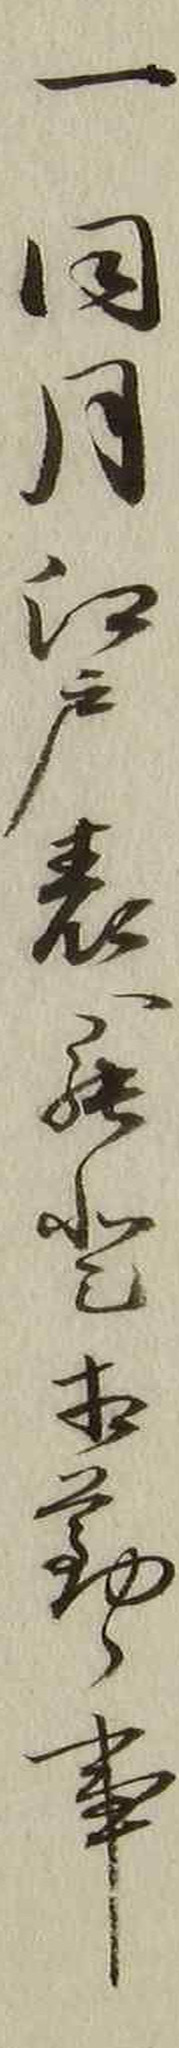一同月江戸表罷登相勤候事
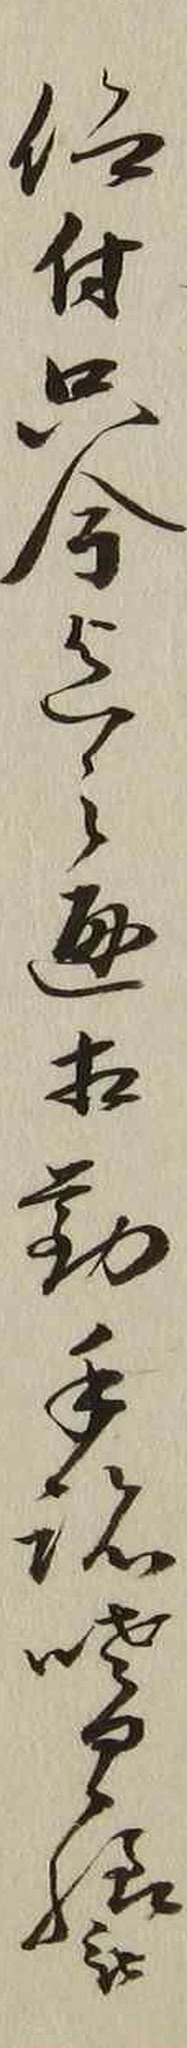仰付只今迄之通相勤手跡嗜候様被
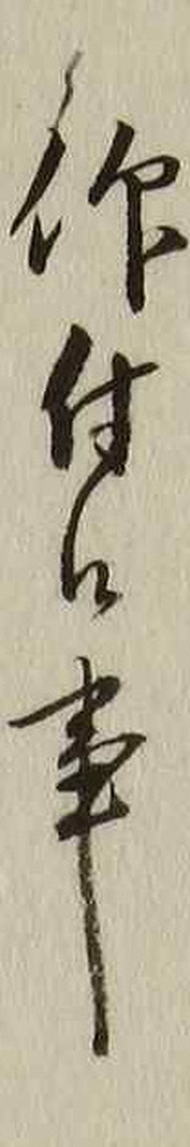仰付候事
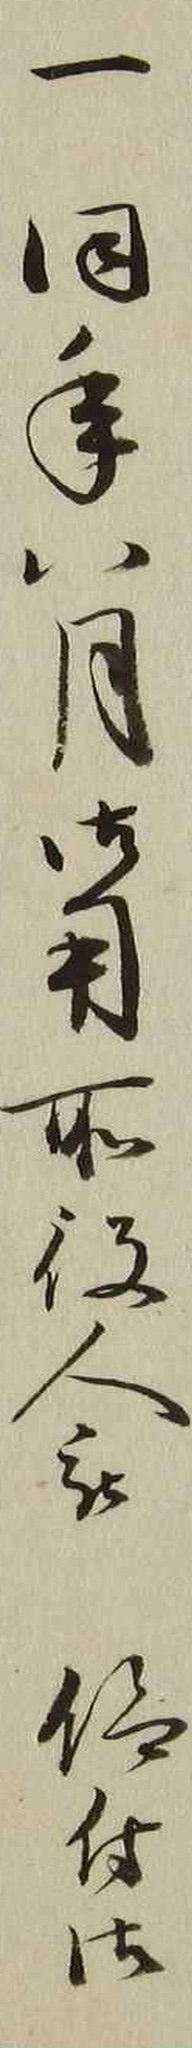一同年八月御用所役人被仰付御
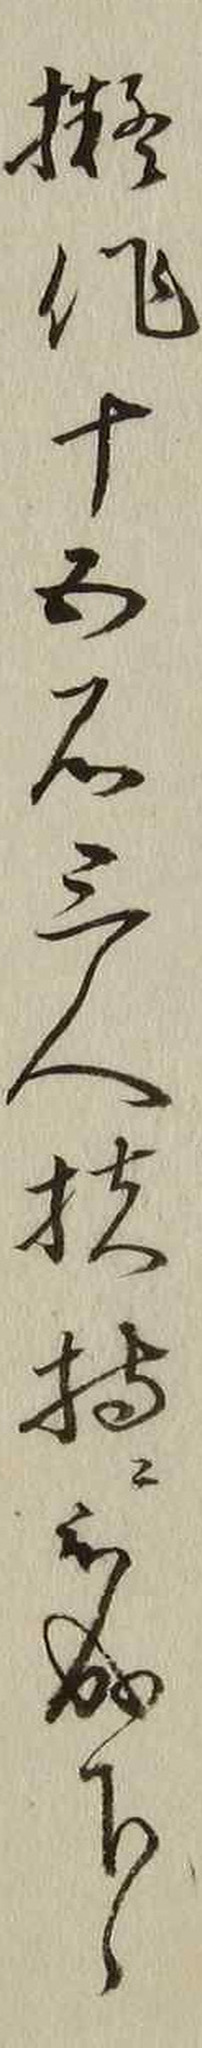擬作十五石三人扶持被成下候
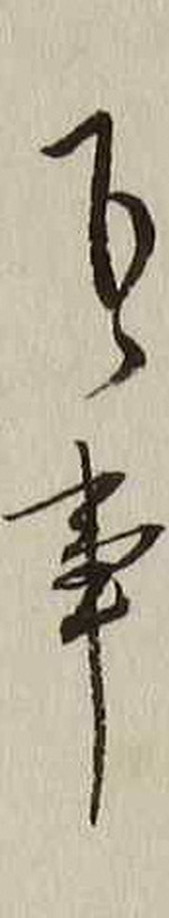下候事
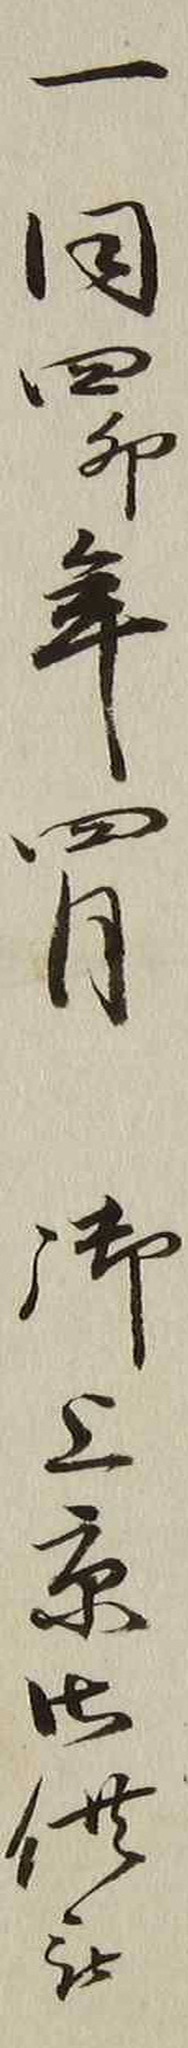一同四卯年四月御上京御供被
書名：諸士系譜　巻之102　か之部10
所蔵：会津若松市立会津図書館
